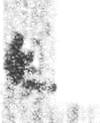於
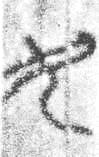民
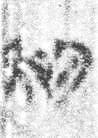利（利）
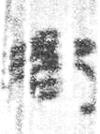○（嘑）
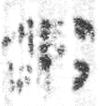合（答）
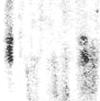曰
